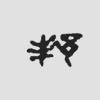邦
